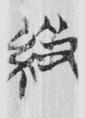級
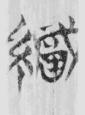織
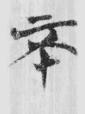不
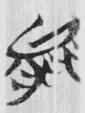能
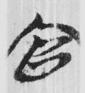官
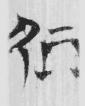凥
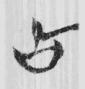占
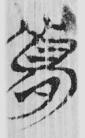夢
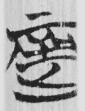{辛用止}
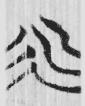永
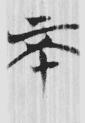不
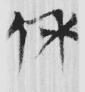休
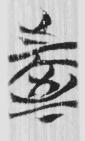{之室}
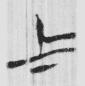上
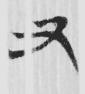又
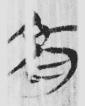兔
